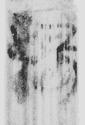湯
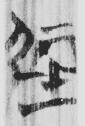{尸几土}
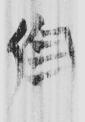於
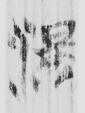湯
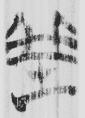{丘土}
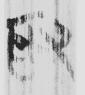取
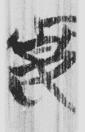妻
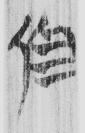於
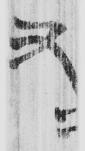又=
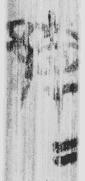{邑木辛}=
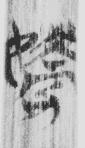{女舛亼几力}
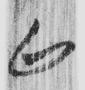㠯（以）
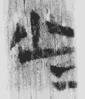少=
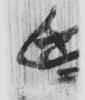臣=
